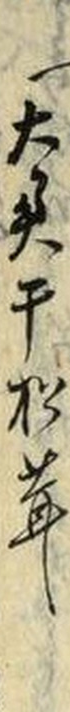大奥干松茸
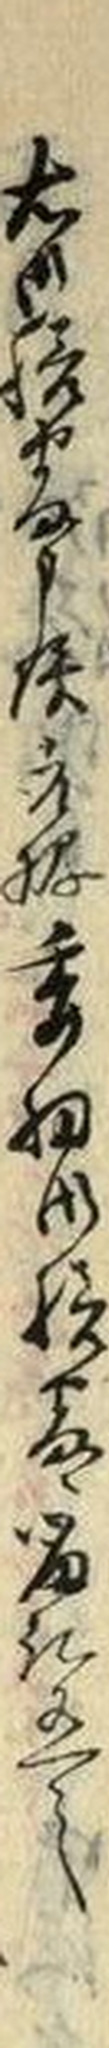右御膳番申談取扱委細御膳番ニ留記有之
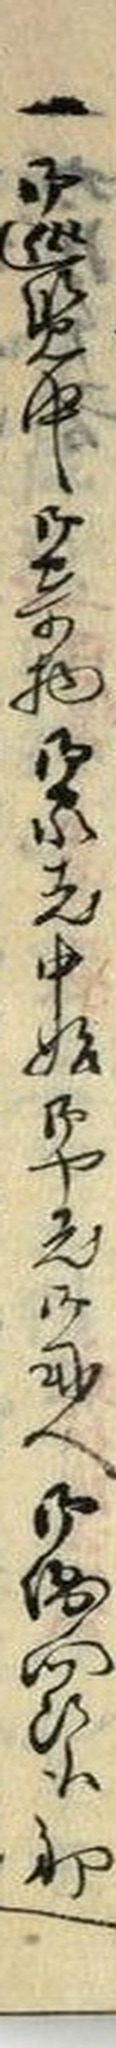一御巡覧中御奇物御家老中始御中老御用人御側向頭取初
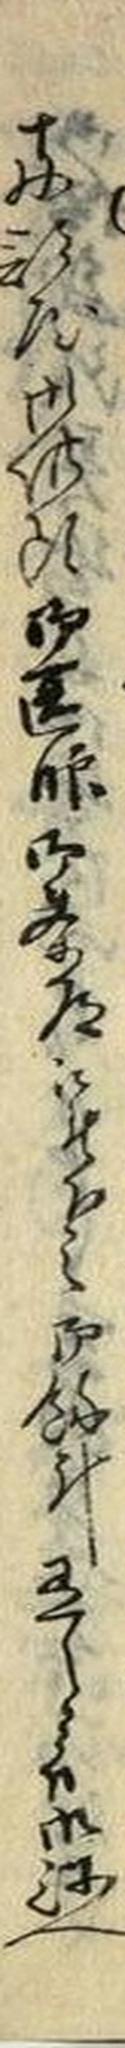両部屋御供頭御医師御茶道江被下之御余計有之候ニ付御役人

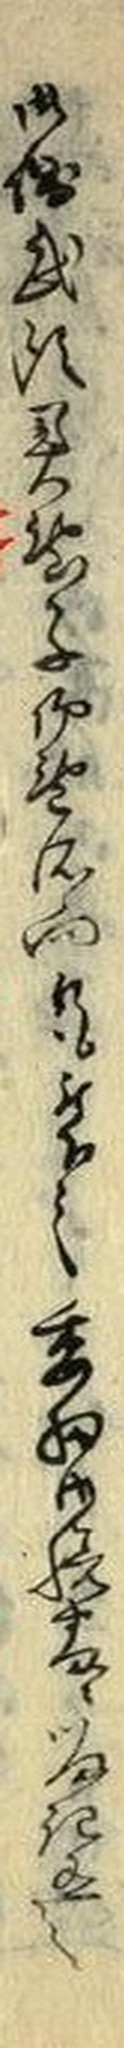御側武頭奥台子御台所向江も被下之委細御膳番ニ留記有之
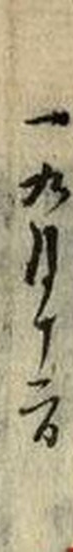一九月十二日
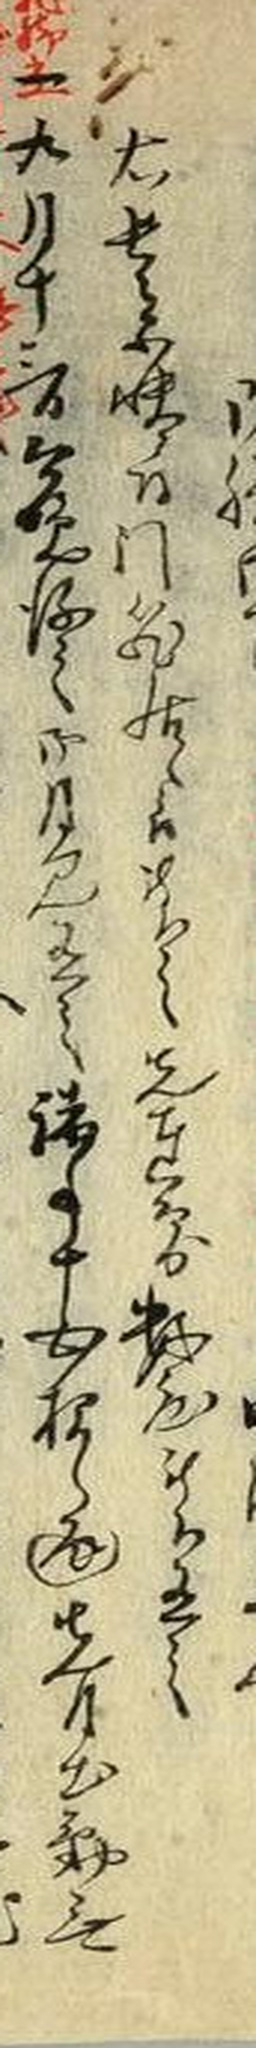一九月十三日今晩後之御月見有之諸事十五夜之通先月出勤無
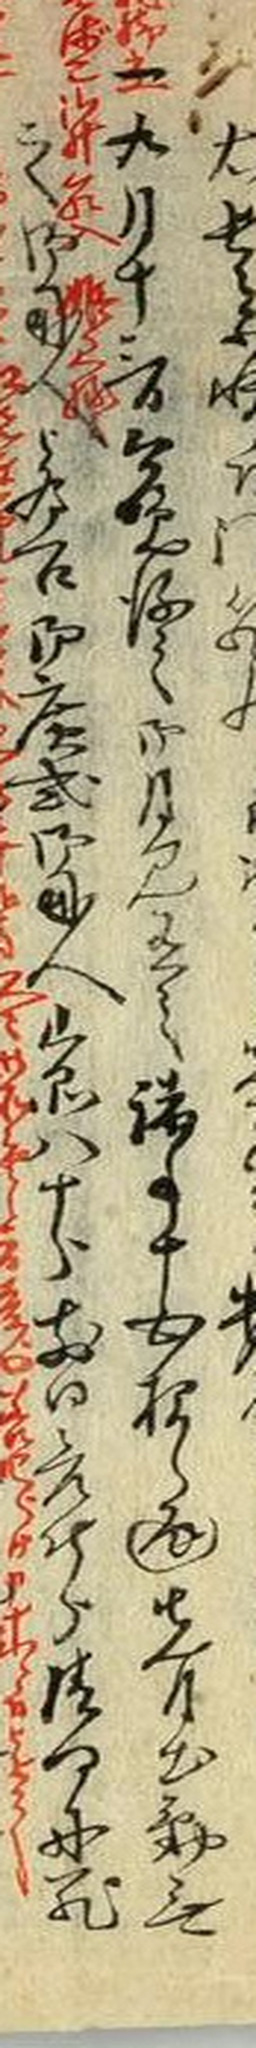之御用人被為召御広式御用人山品八十郎前田彦次郎清田丹蔵
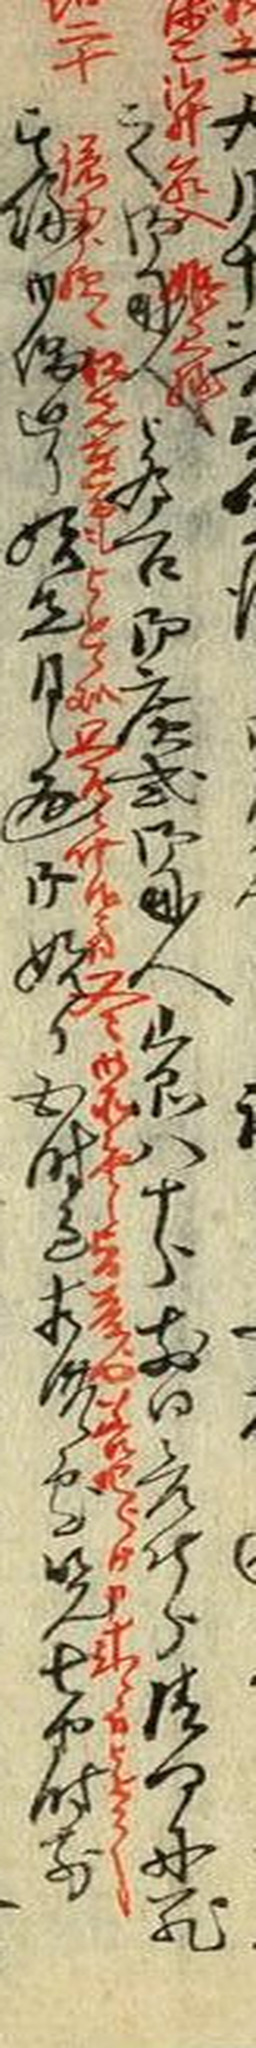其余御側廻り始先月之通御始り五時過相済候処暁七半時前
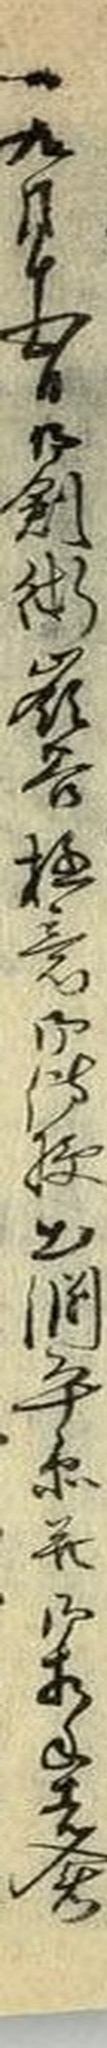一九月十五日御剣術嶺谷極意御伝授出淵平兵衛幷御打手吉倉
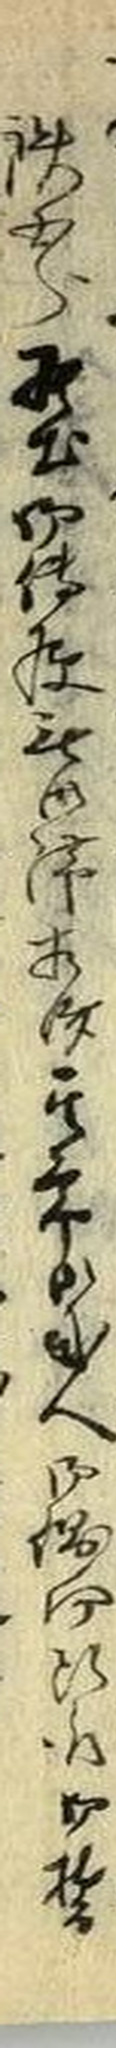鉄五郎罷出御伝授無御滞相済其節御用人御側向頭取御稽
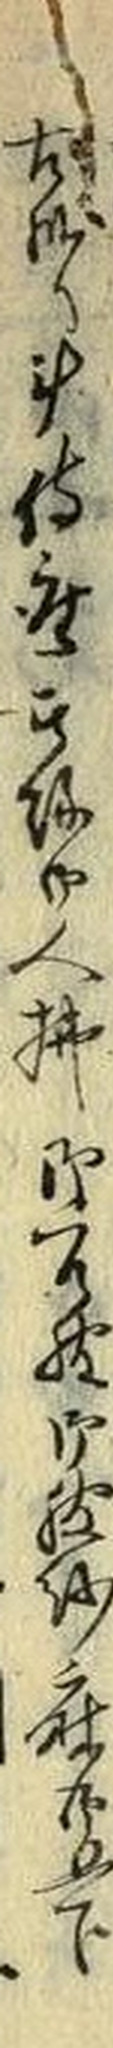古掛り斗侍座其後御人払御召服御服紗麻御上下
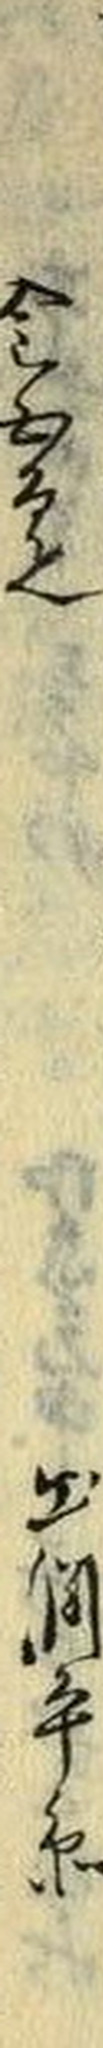金五百疋出淵平兵衛
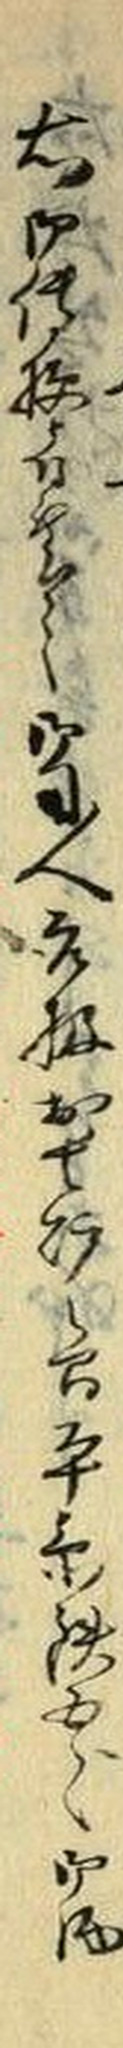右御伝授ニ付被下之御用人取扱於長炉之間平兵衛鉄五郎へ御酒
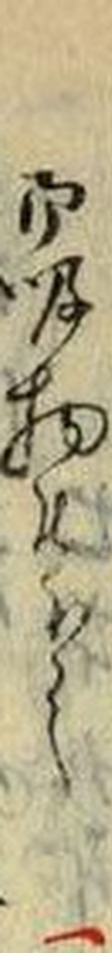御吸物被下之
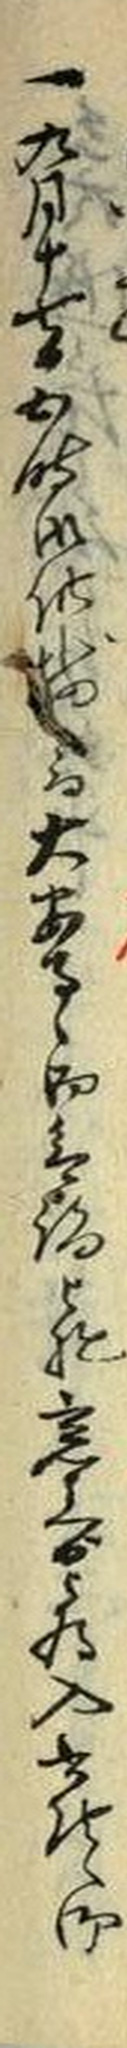一九月十七日五時御供揃ニ而大安寺へ御参詣被遊玄関ゟ被為入書院へ御
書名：少傅日録抄（斉承付側向頭取日記、在国）
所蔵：福井県文書館 Fukui Prefectural Archives
